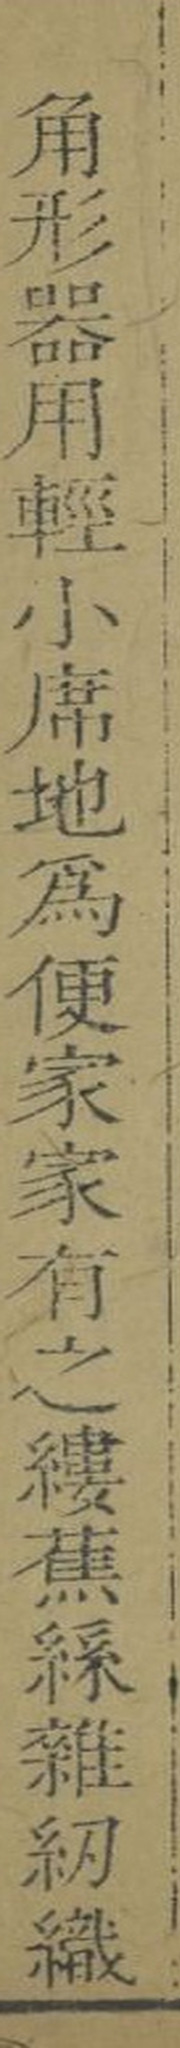角形器用軽小席地為便家家有之縷蕉糸雑紉織

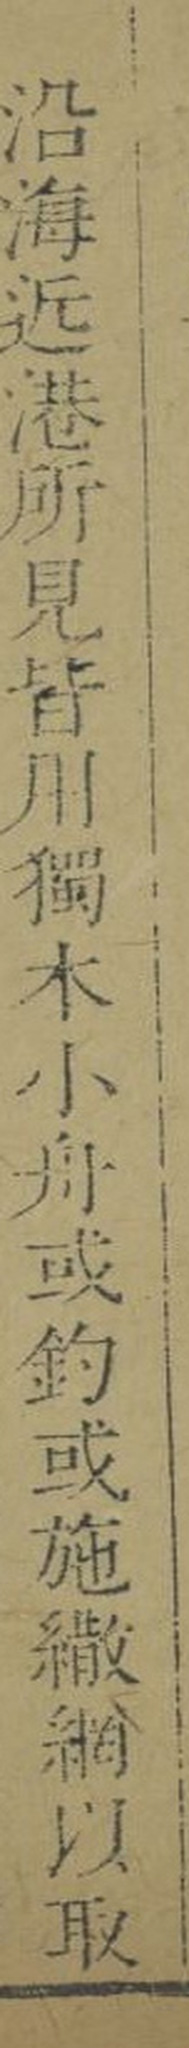沿海近港所見皆用独木小舟或釣或施繖網以取
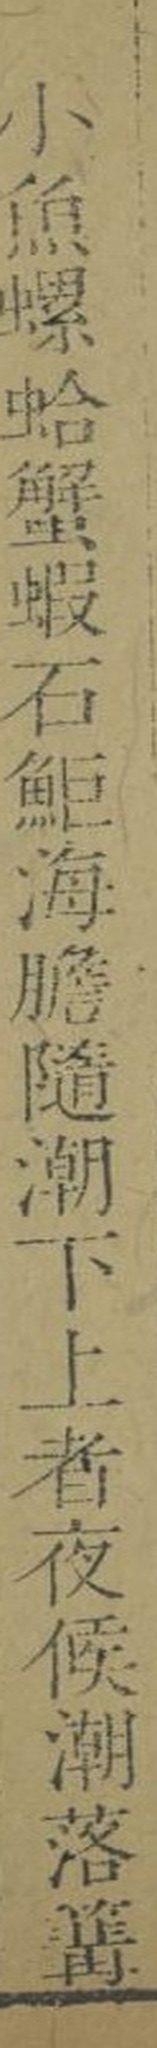小魚螺蛤蟹蝦石鮔海胆随潮下上者夜候潮落篝
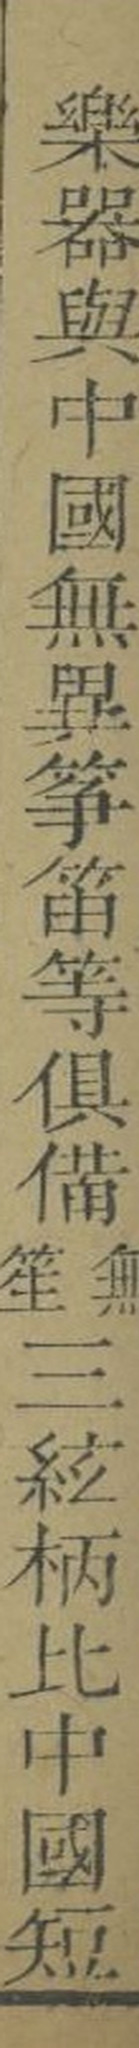楽器与中国無異筝笛等俱備無笙三絃柄比中国短
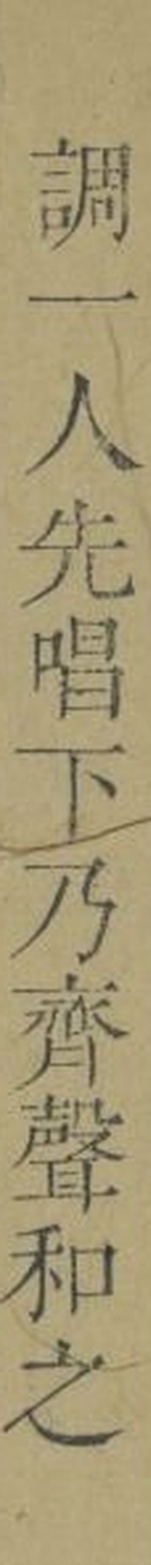調一人先唱下乃斉声和之
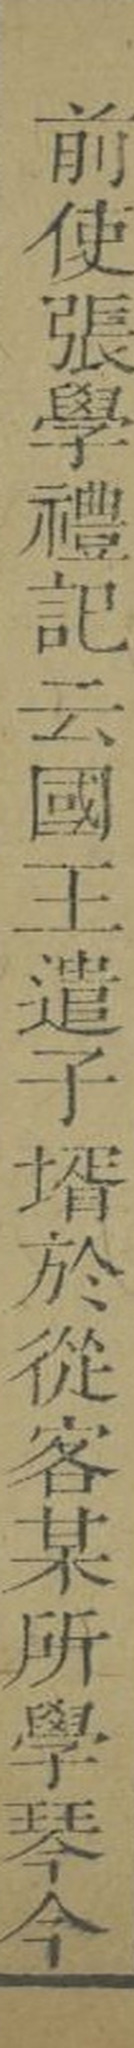前使張学礼記云国王遣子婿於従客某所学琴今
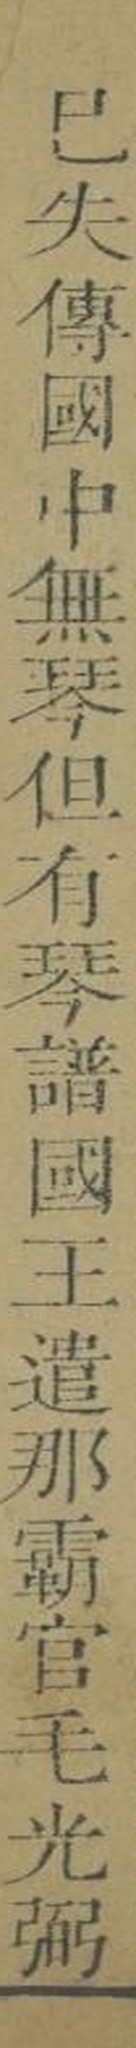巳失伝国中無琴但有琴譜国王遣那霸官毛光弼
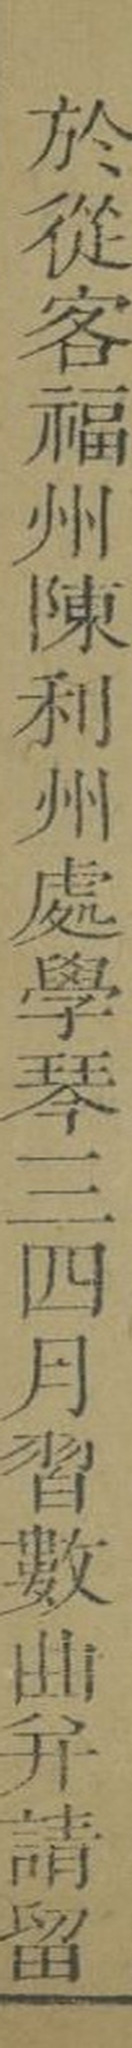於従客福州陳利州処学琴三四月習数曲幷請留
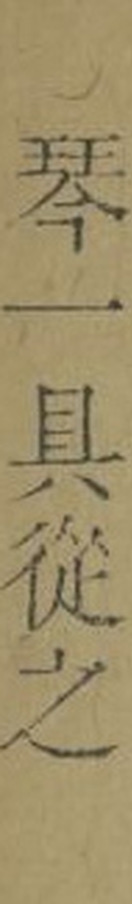琴一具従之

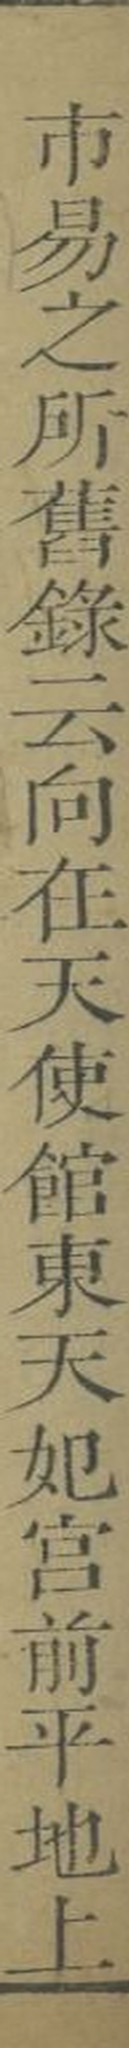市易之所旧録云向在天使館東天妃宮前平地上
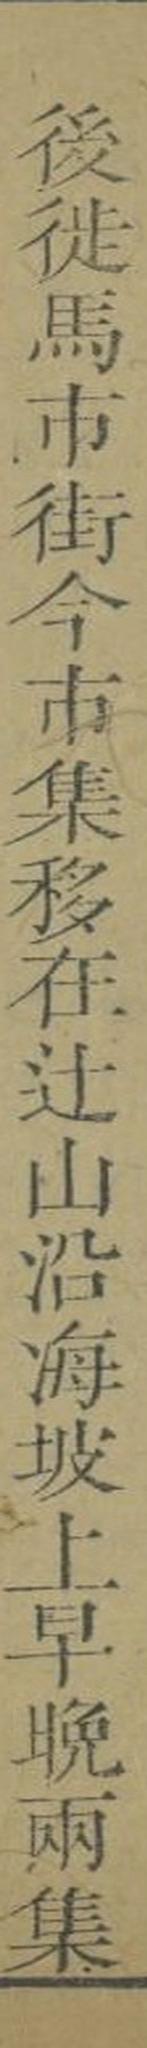後徙馬市街今市集移在辻山沿海坡上早晩両集
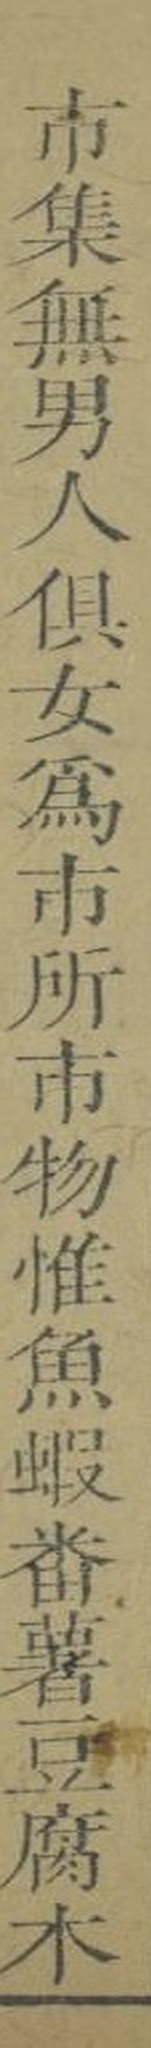市集無男人俱女為市所市物惟魚蝦畨薯豆腐木
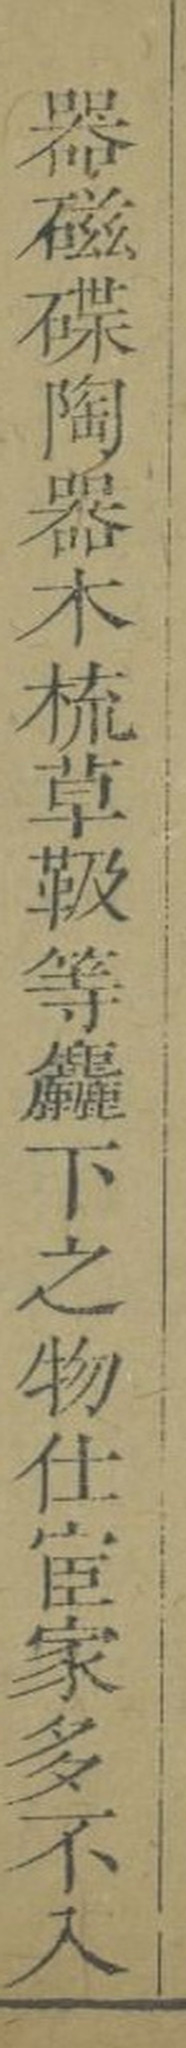器磁碟陶器木梳草靸等麤下之物仕宦家多不入

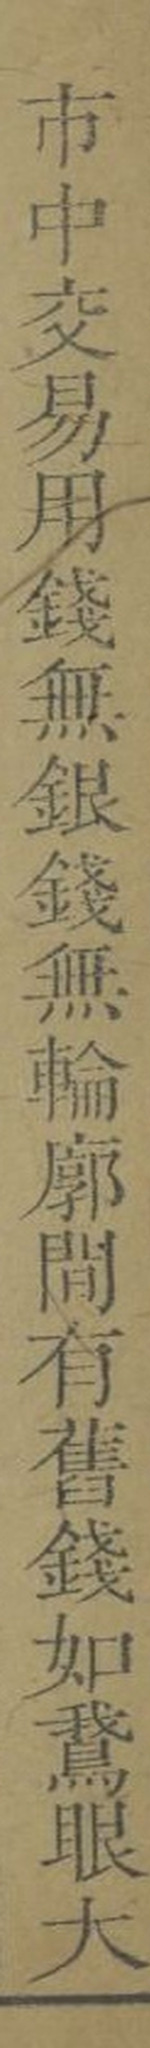市中交易用銭無銀銭無輪廓間有旧銭如鵞眼大
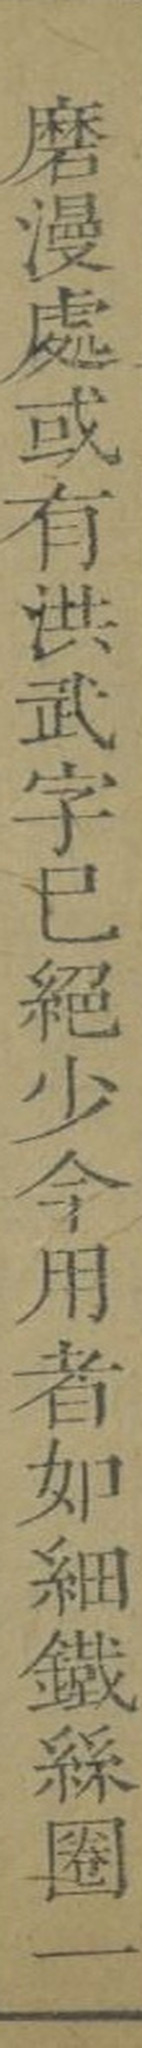磨漫処或有洪武字巳絶少今用者如細鉄糸圏一
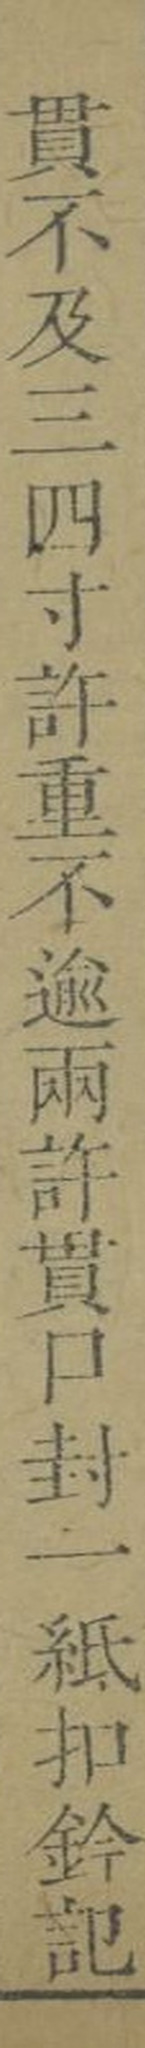貫不及三四寸許重不逾両許貫口封一紙扣鈴記
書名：中山伝信録 巻六
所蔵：University of the Ryukyus Library
